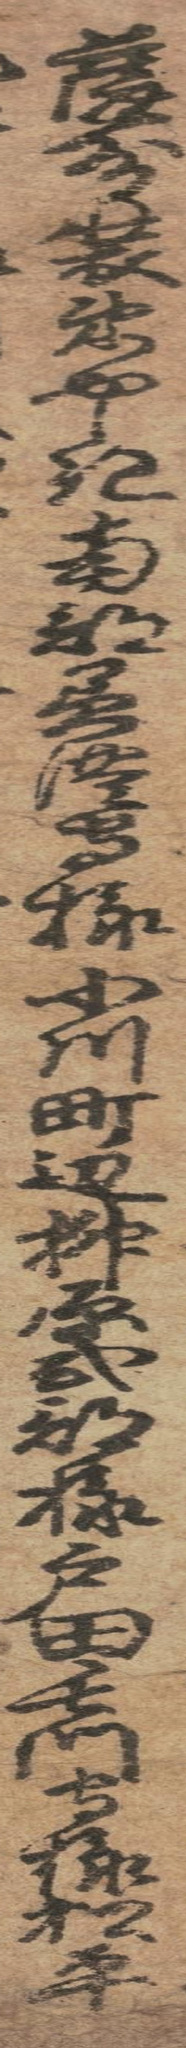薩州装束やしき南部美濃守様小川町辺榊原式部様戸田長門守様松平
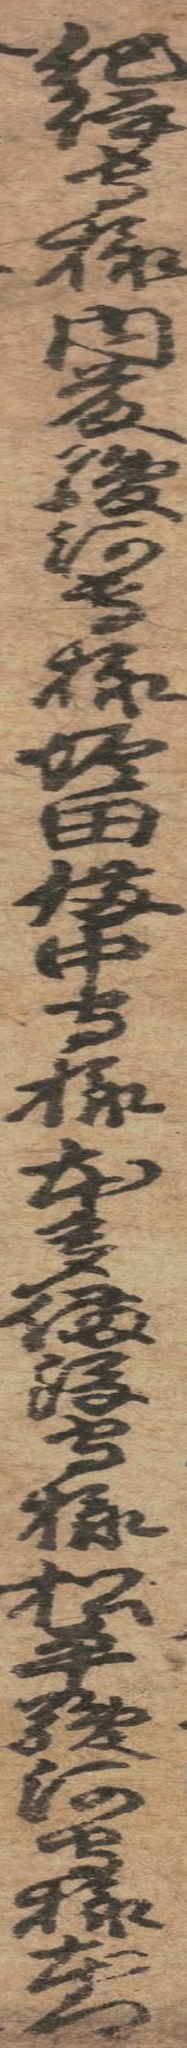紀伊守様内藤駿河守様増田備中守様本多備後守様松平駿河守様本郷
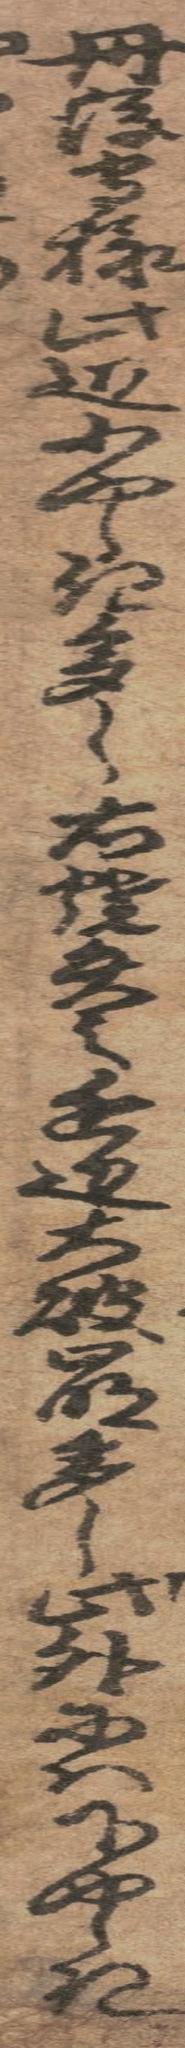丹後守様此辺小やしき多し右焼失し近辺大破崩多し此外にハ下やしき
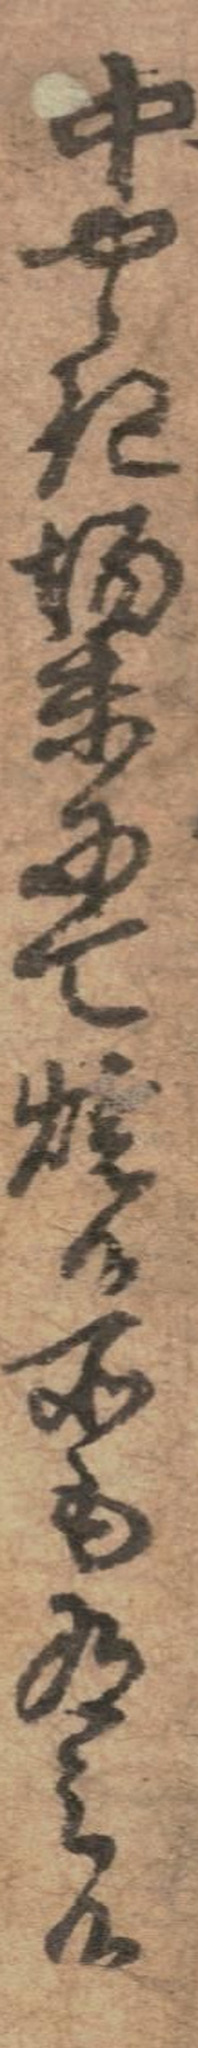中やしき場末にて焼る所も有之候
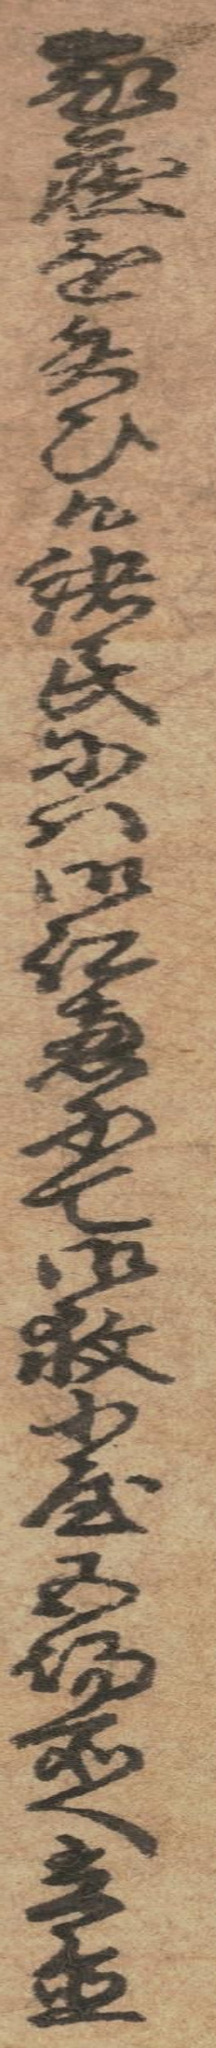家蔵を失ひ候諸氏にハ御仁恵にて御救小屋五場所へ立置
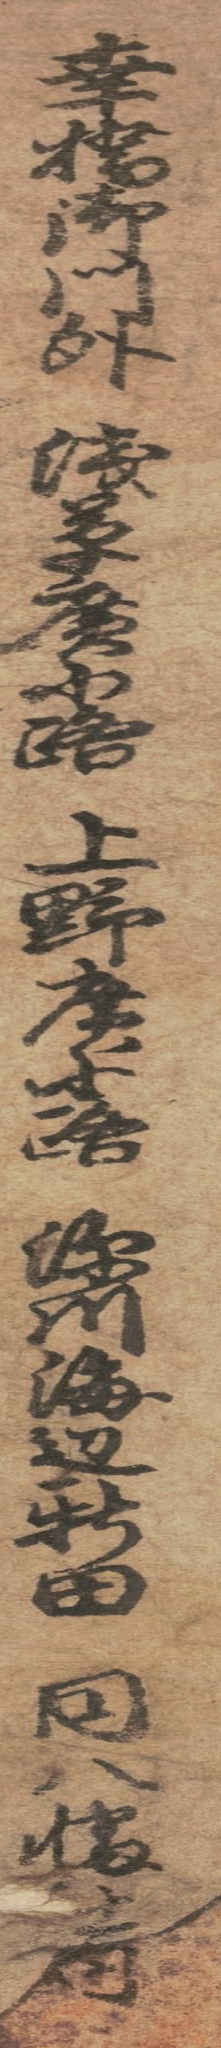幸橋御門外浅草広小路上野広小路深川海辺新田同八幡
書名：[安政江戸地震に関する瓦版]
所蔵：東京大学地震研究所図書室 Earthquake Research Institute Library, The University of Tokyo, JAPAN
